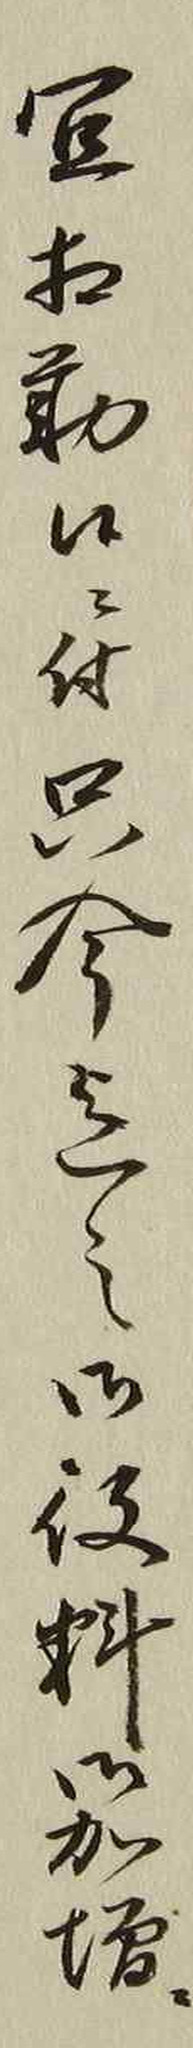宜相勤候ニ付只今迄之御役料御加増ニ
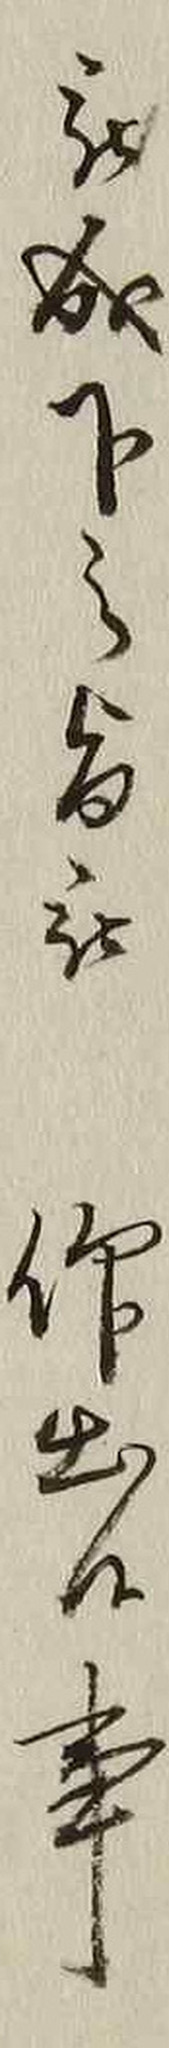被成下之旨被仰出候事
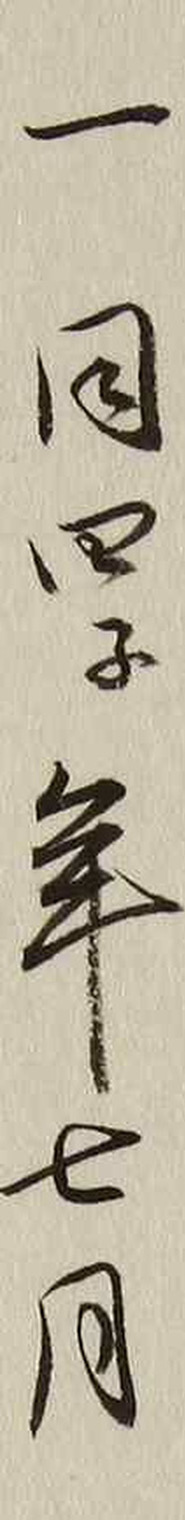一同四子年七月
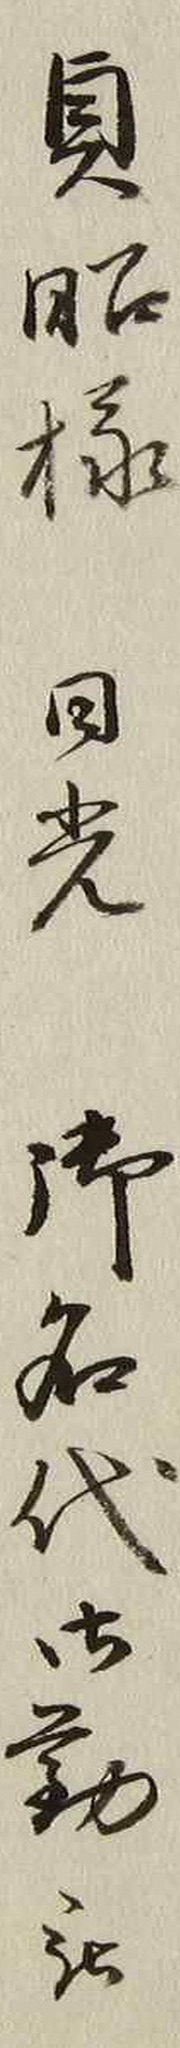貞昭様日光御名代御勤被
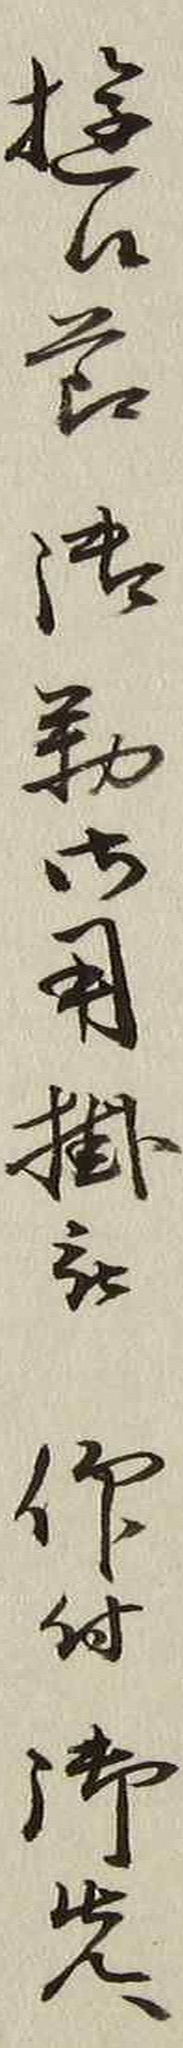遊候節御勤御用掛被仰付御先へ
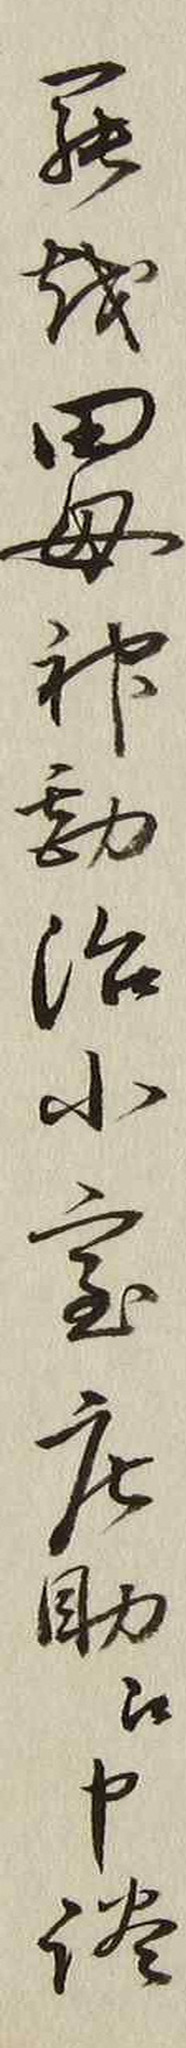罷越田母神勘治小室庄助え申談
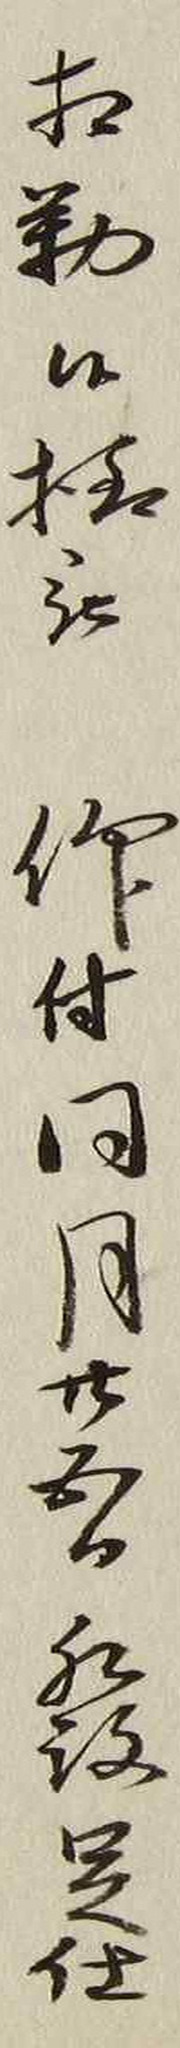相勤候様被仰付同月廿五日発足仕
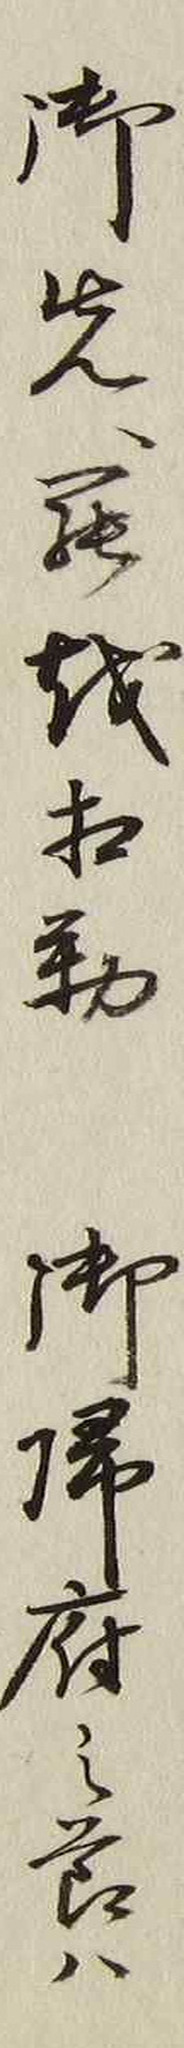御先へ罷越相勤御帰府之節ハ
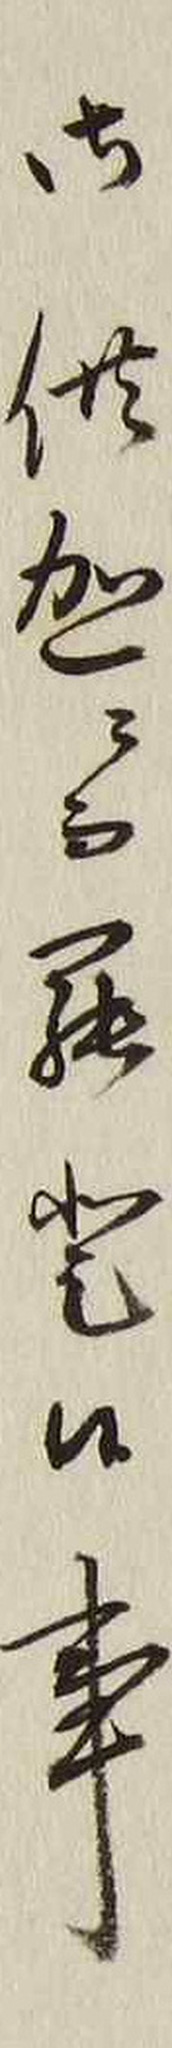御供廻ニ而罷登候事
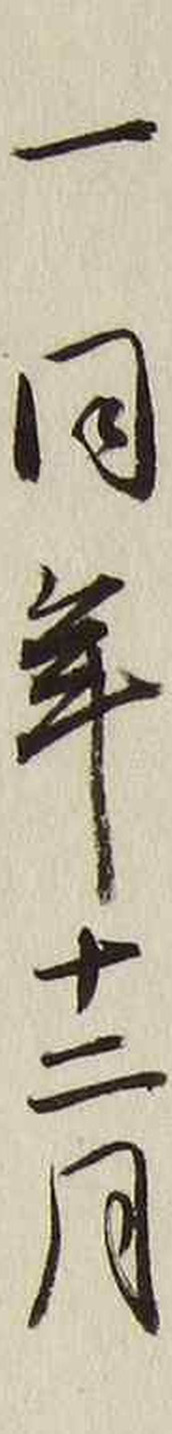一同年十二月
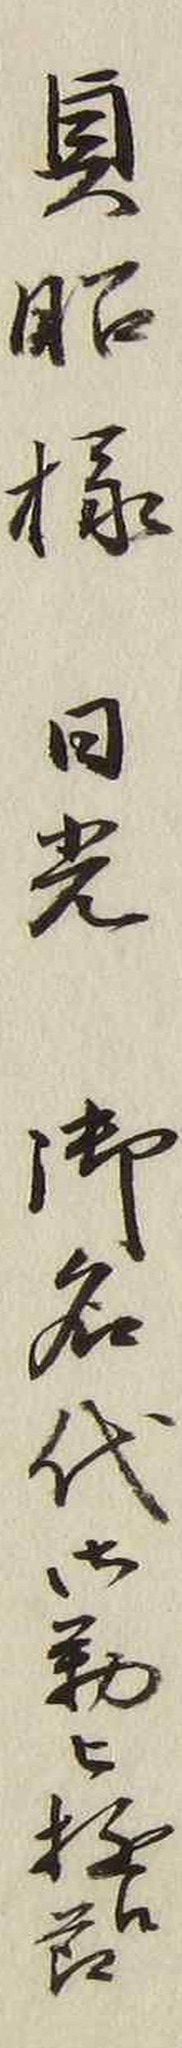貞昭様日光御名代御勤被遊候節

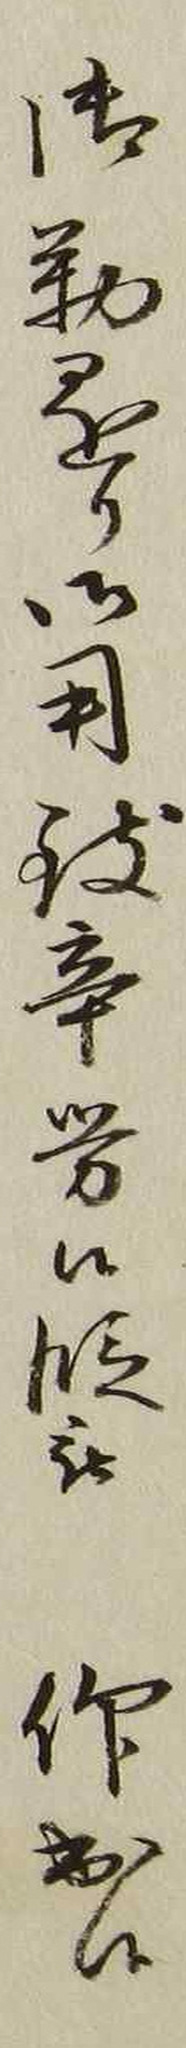御勤懸り御用致辛労候段被仰出候
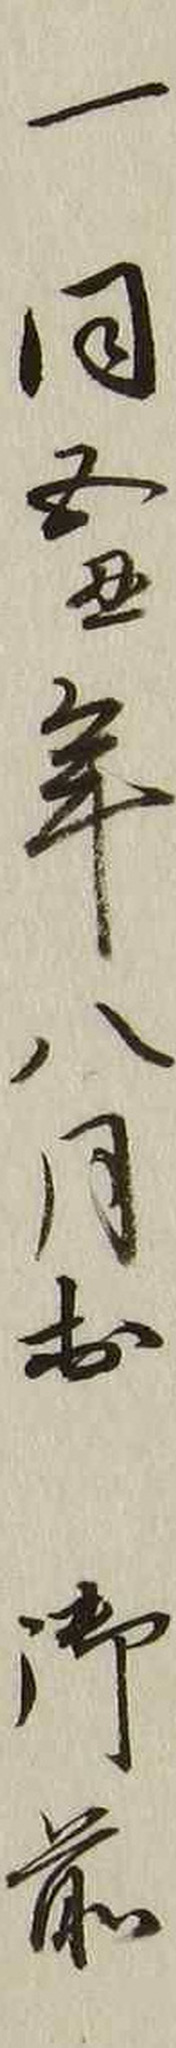一同五丑年八月於御前
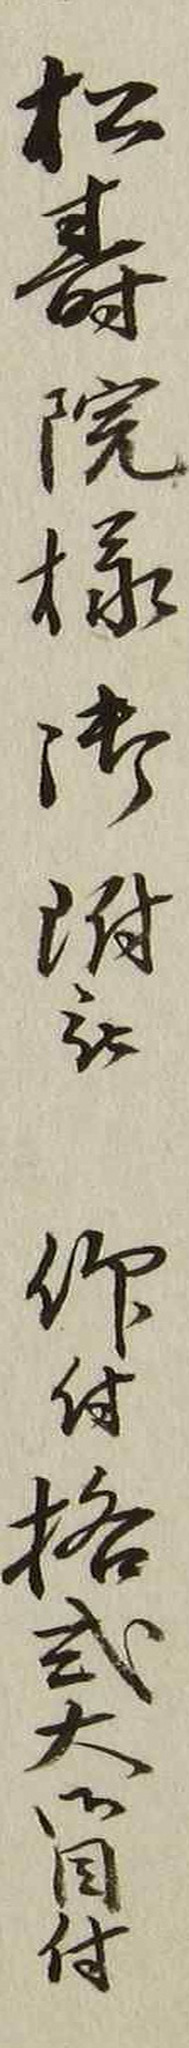松寿院様御附被仰付格式大御目付
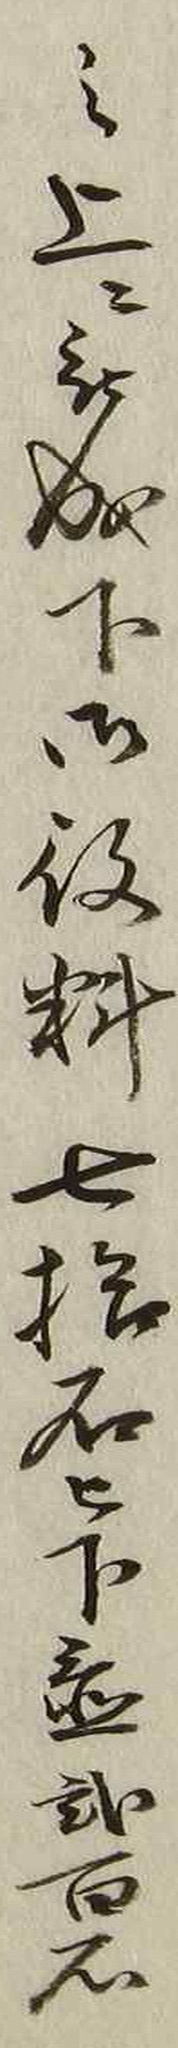之上ニ被成下御役料七拾石被下置弐百石
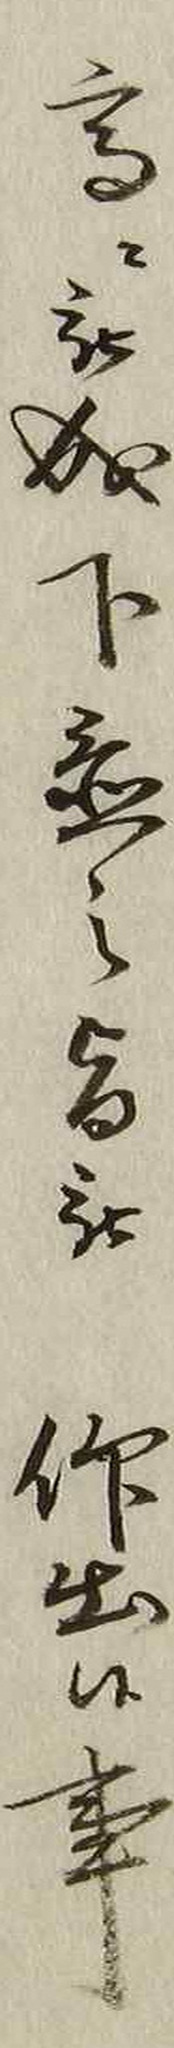高ニ被成下置之旨被仰出候事
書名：諸士系譜　巻之160　な之部2
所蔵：会津若松市立会津図書館
